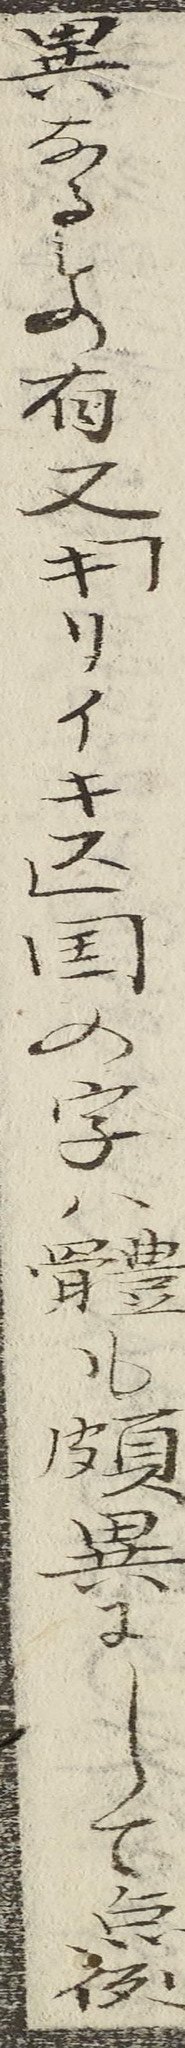異なるもの有又「キリイキス」国の字ハ体も頗異にして点例
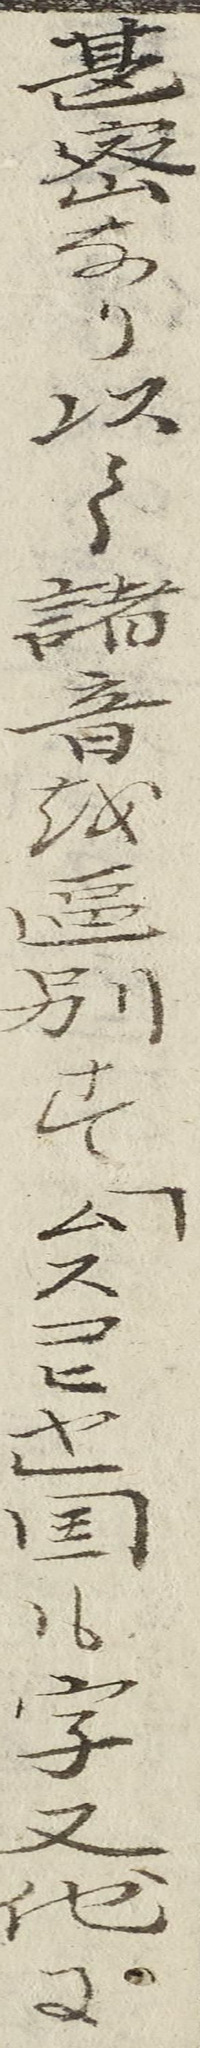甚密なり以て諸音を区別す「ムスコヒヤ」国も字又他に
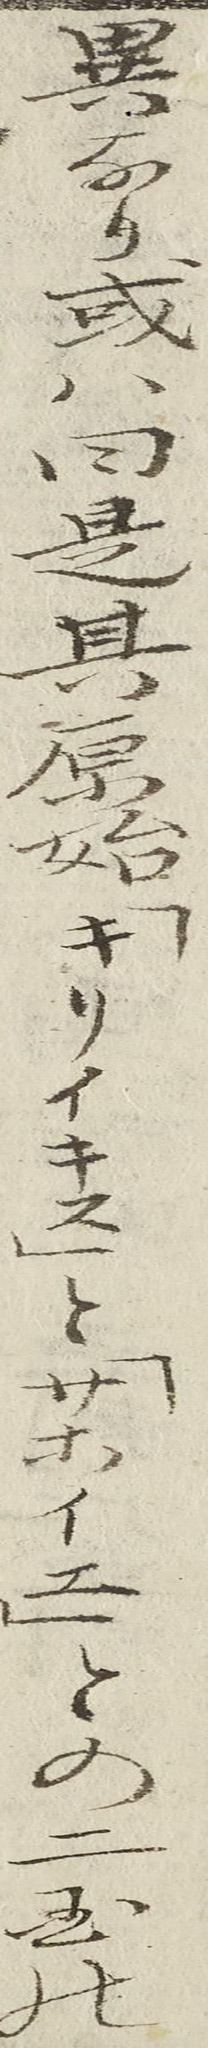異なり或ハ曰是其原始「キリイキス」と「サホイエ」との二国の
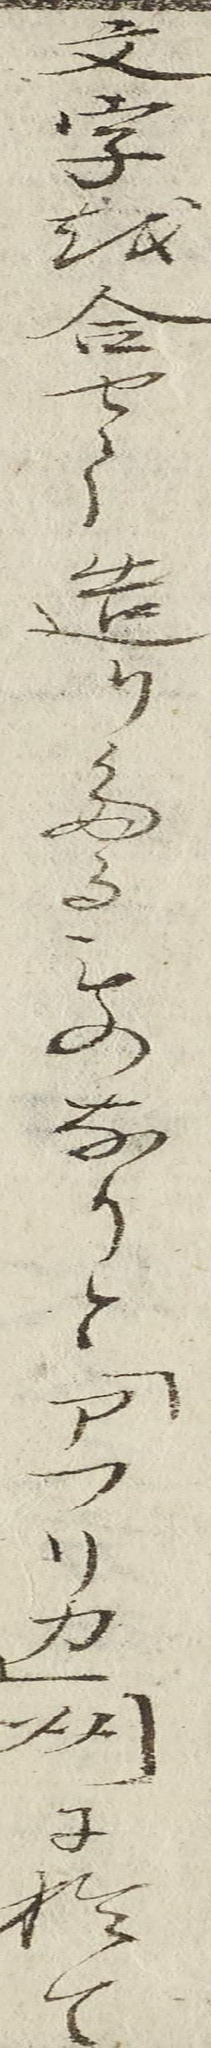文字を合せて造りたるものなりと「アフリカ」州に於て
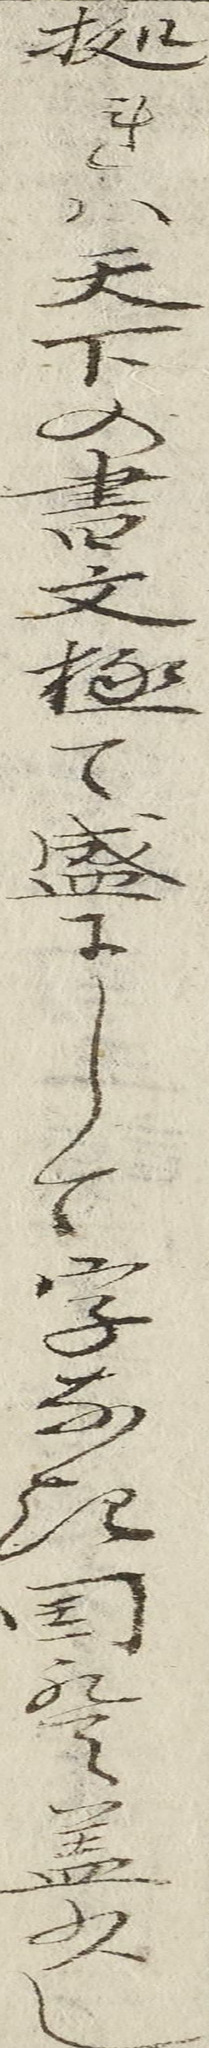拠れハ天下の書文極て盛にして字なき国は蓋し少し
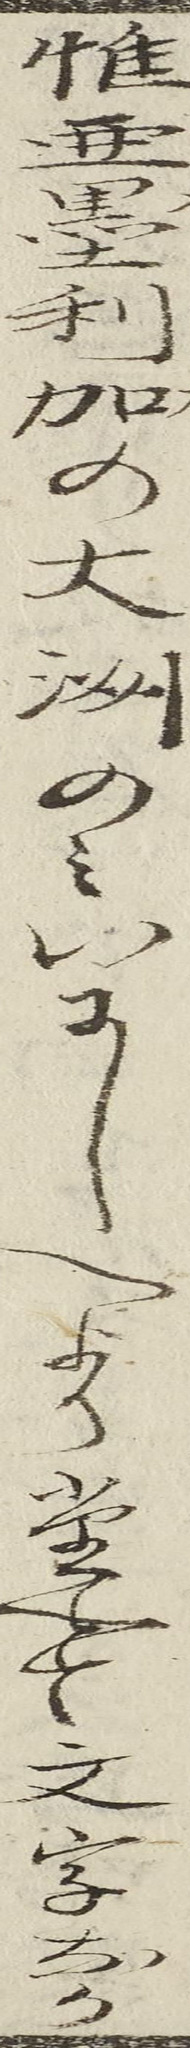惟亜墨利加の大州のミいにしへよりたへて文字なか
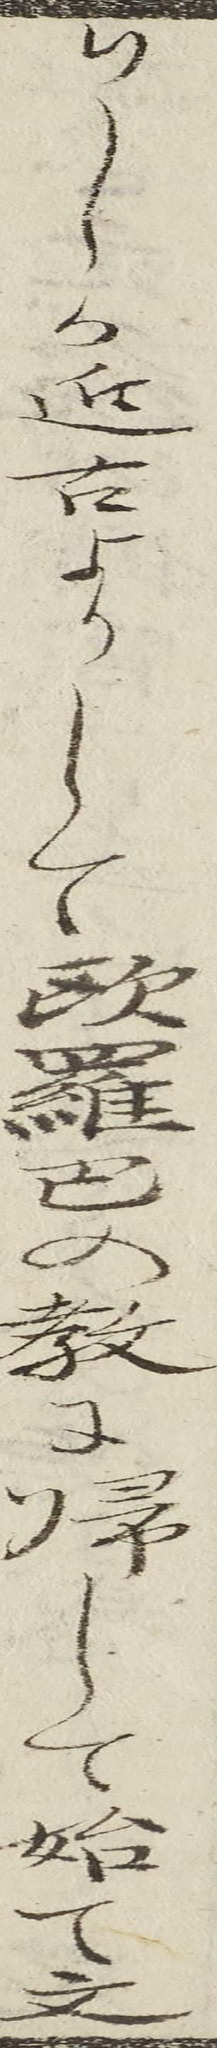りしか近古よりして欧羅巴の教に帰して始て文
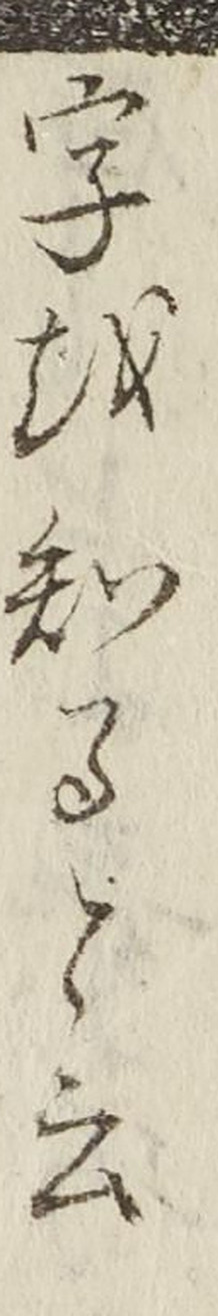字を知ると云
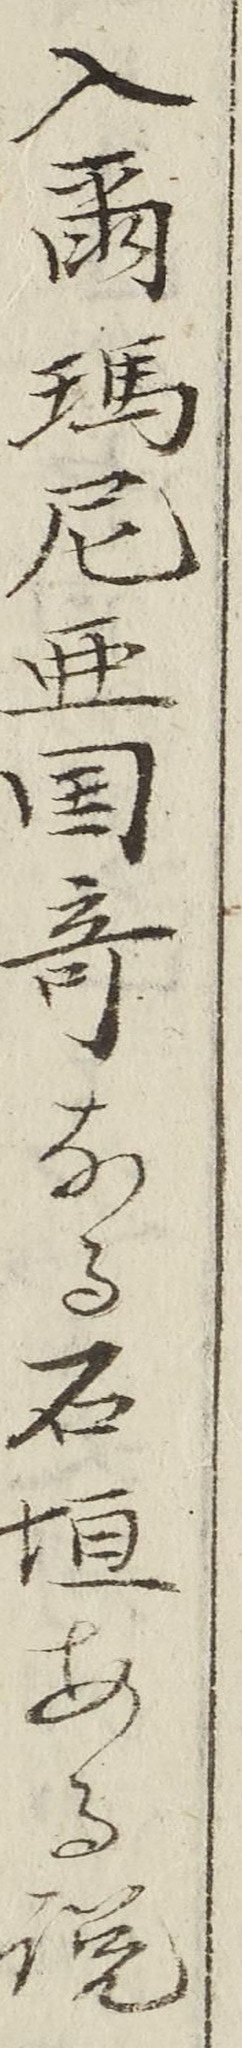入爾瑪尼亜国奇なる石垣ある説
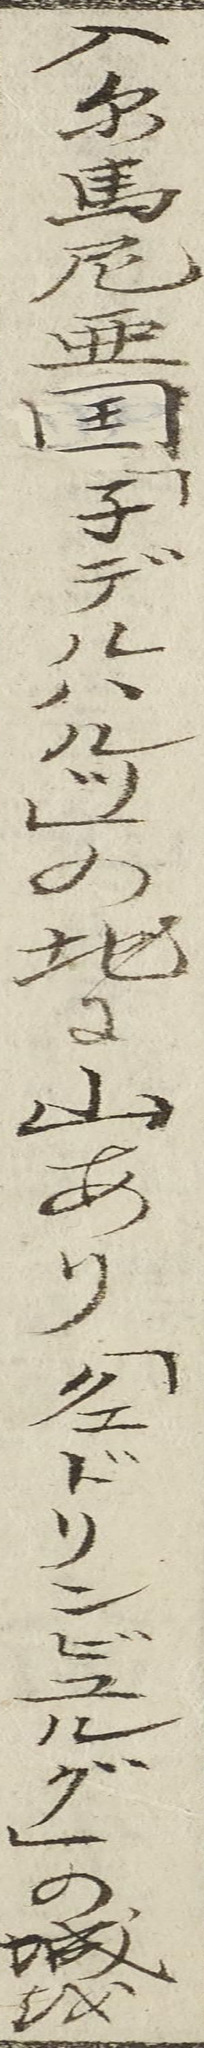入爾瑪尼亜国「子デルハルツ」の地に山あり「クェドリンビユルグ」の城を
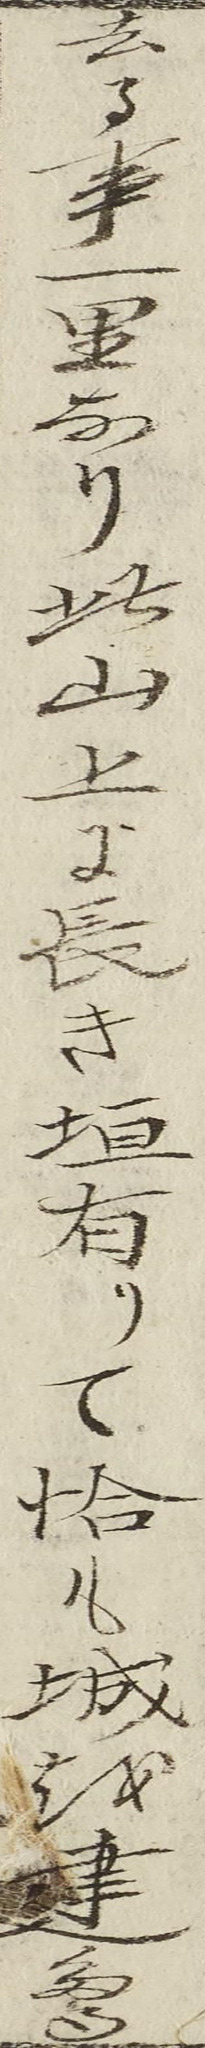去る事一里なり此山上に長き垣有りて恰も城を建たる
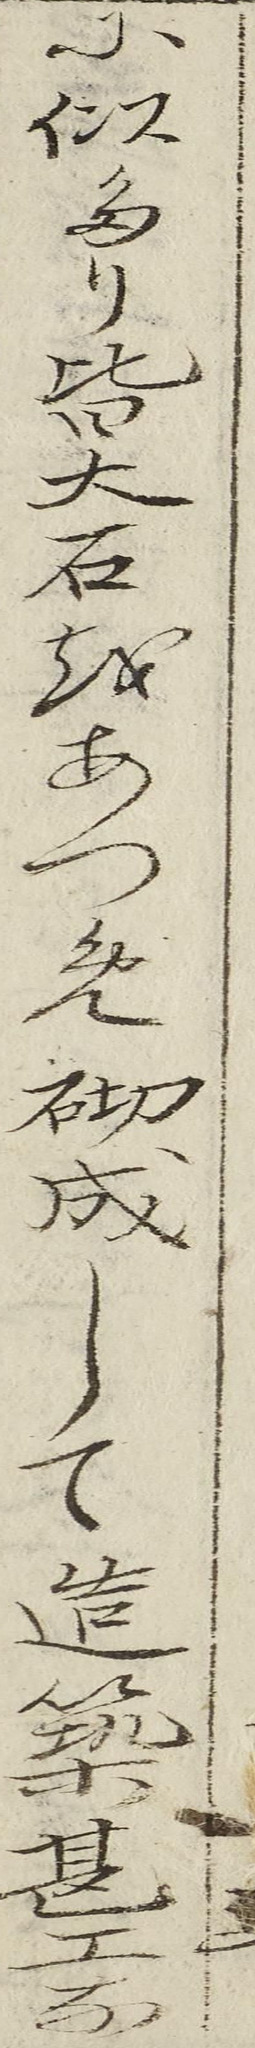に似たり皆大石をあつめ砌成して造築甚工な

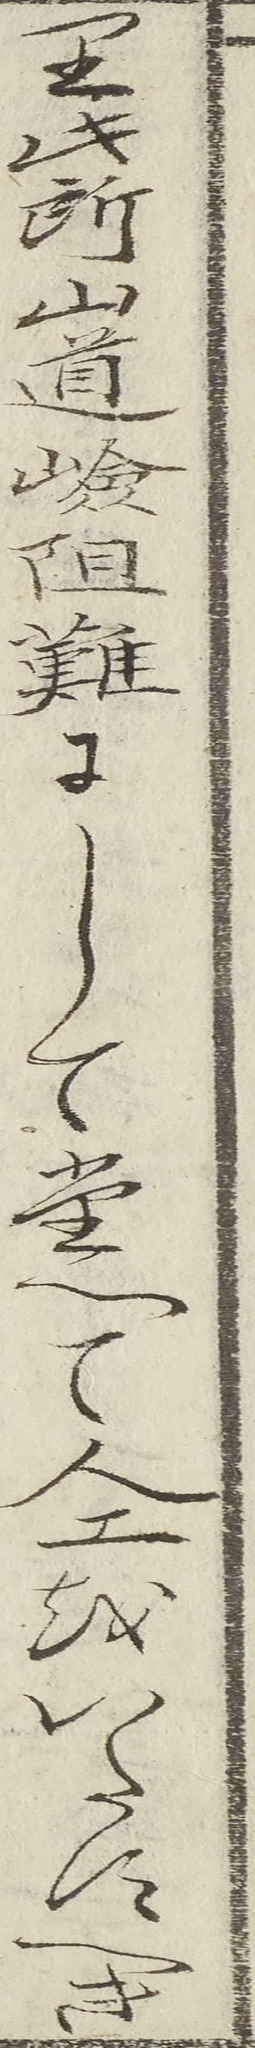り此所山道険阻にしてたへて人工をいたすへき
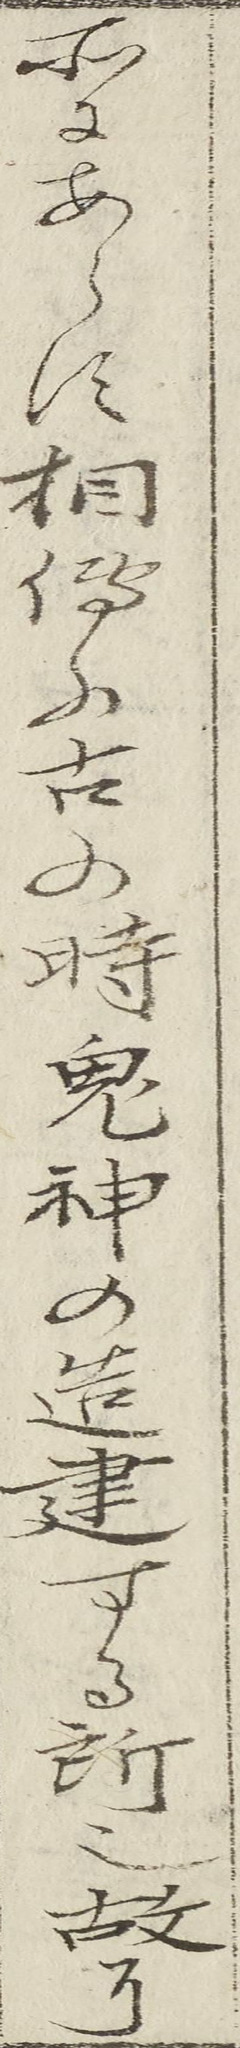所にあらす相伝ふ古の時鬼神の造建する所也故に
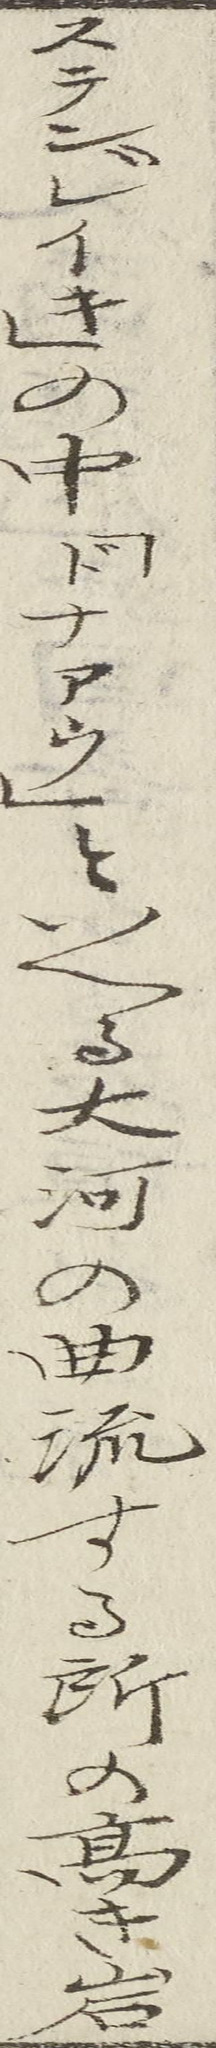スラン〃レイキ」の中「ドナアウ」といへる大河の曲流する所の高き岩
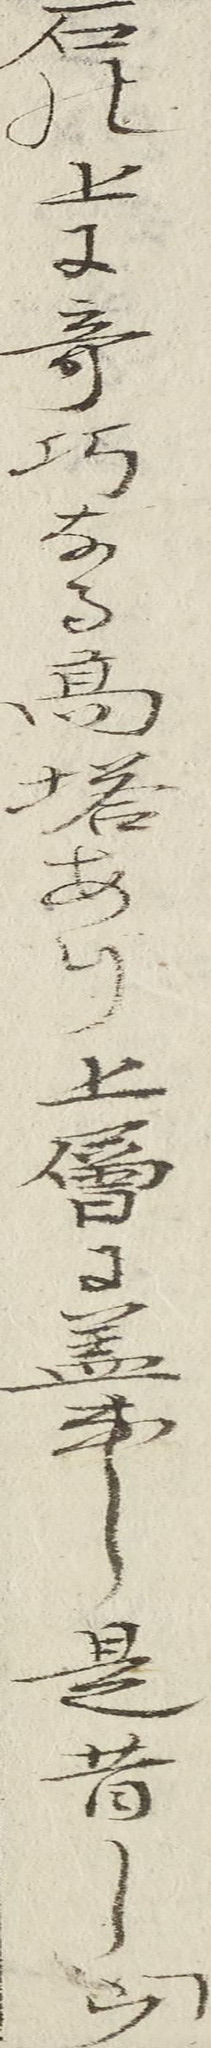石の上に奇巧なる高搭あり上層に蓋なし是昔し「ウ
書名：西洋雜記　坤
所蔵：東京大学地震研究所図書室 Earthquake Research Institute Library, The University of Tokyo, JAPAN
